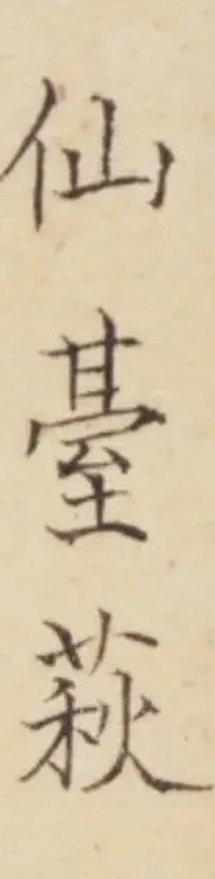仙台萩
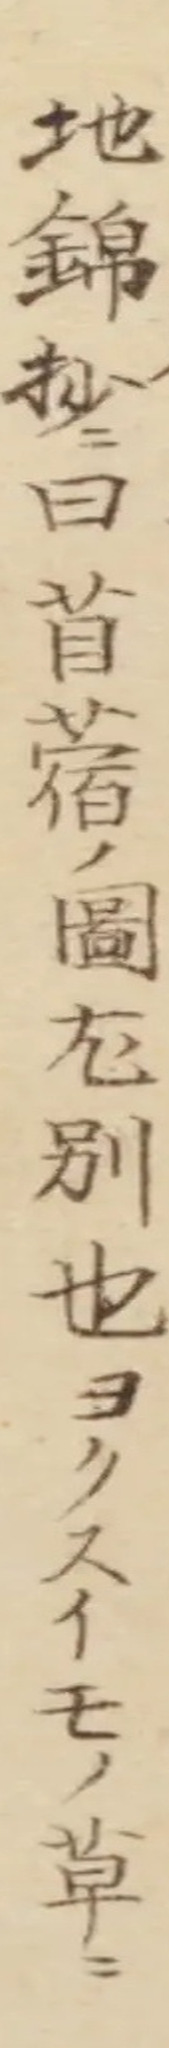地錦抄ニ曰苜蓿ノ図尤別也ヨクスイモノ草ニ
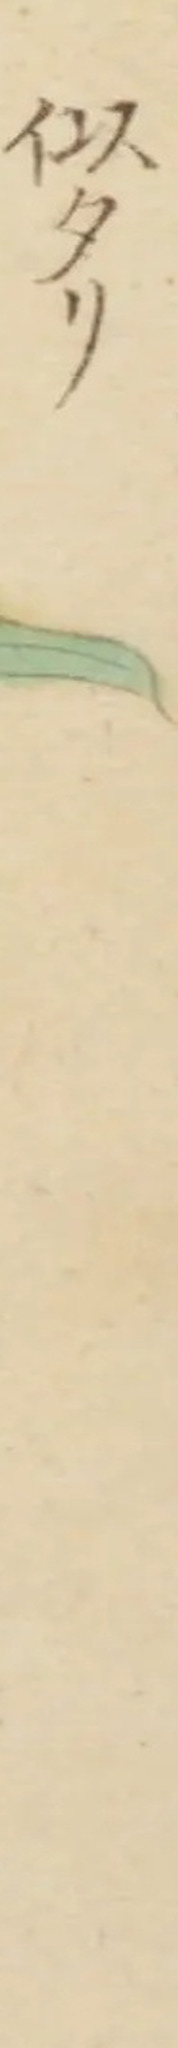似タリ
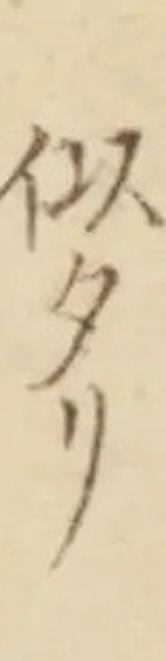似タリ
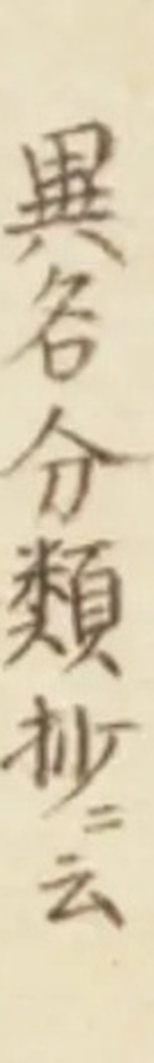異名分類抄云
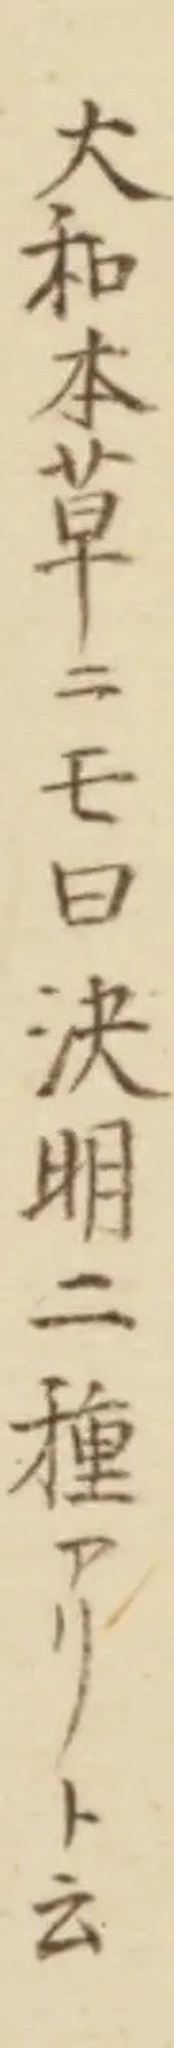大和本草ニモ曰決明二種アリト云
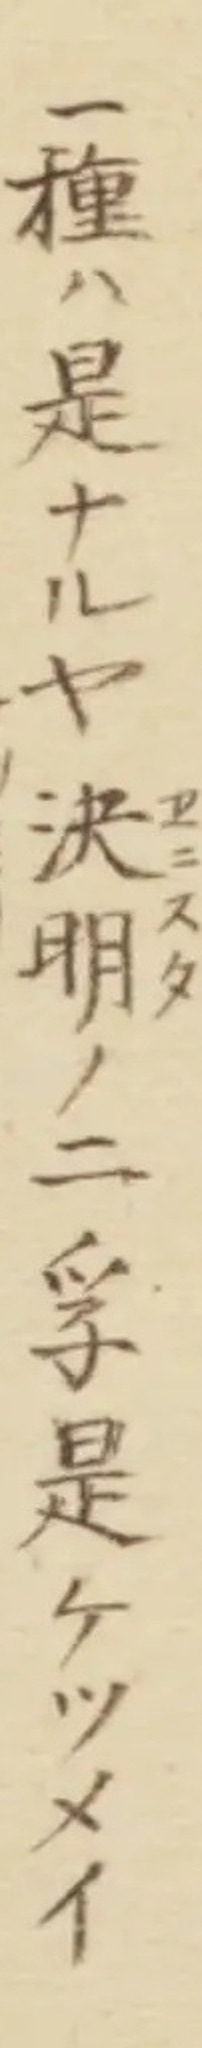一種ハ是ナルヤ決明ノ二字是ケツメイ
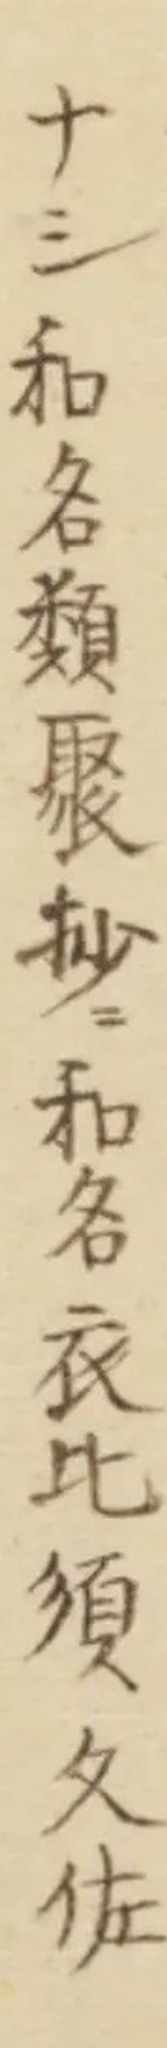ナシ和名類聚抄和名衣比須久佐
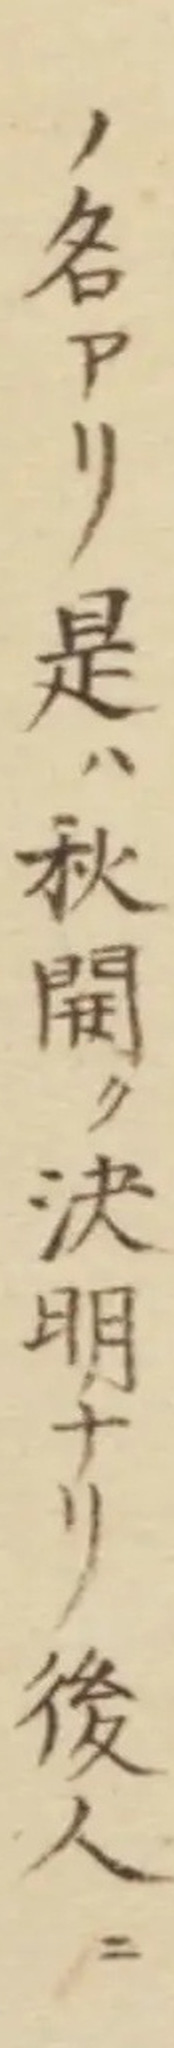ノ名アリ是ハ秋開ク決明ナリ後人
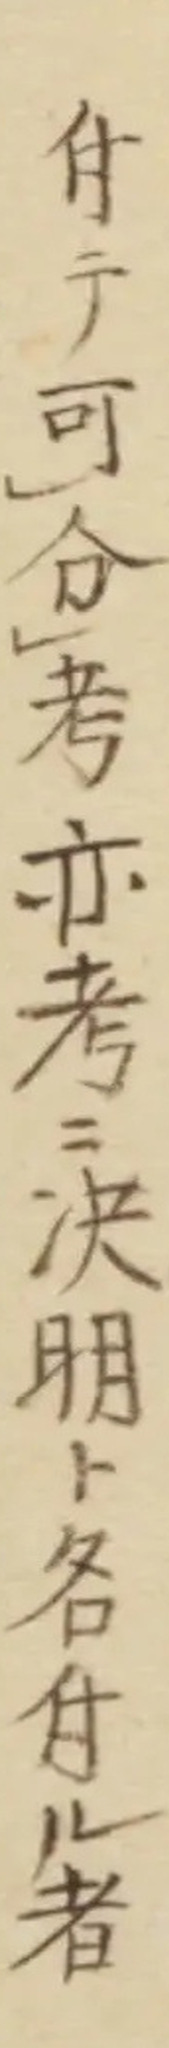付テ可分考亦考ニ決明ト付ル者
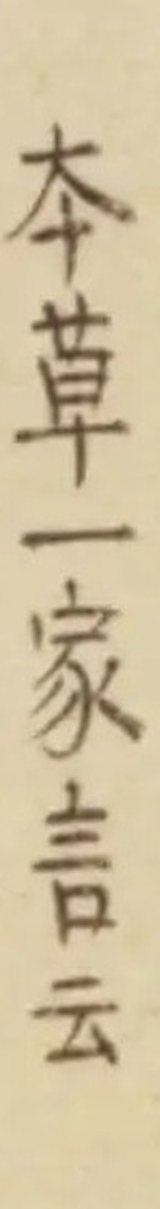本草一家言云
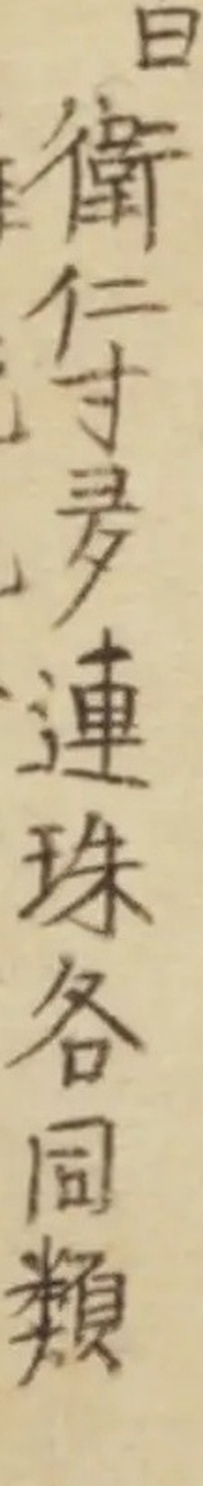衛仁寸多連珠名同類
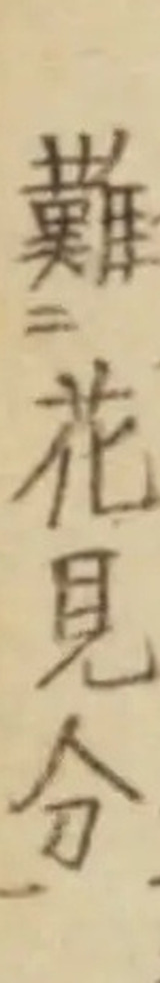難花見分

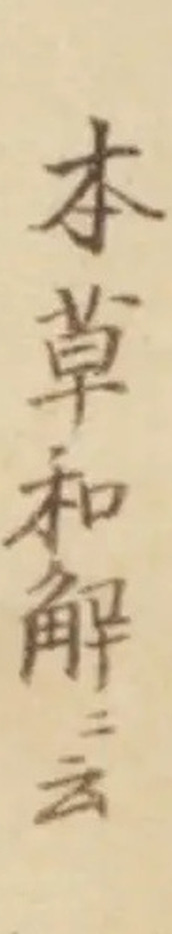本草和解云
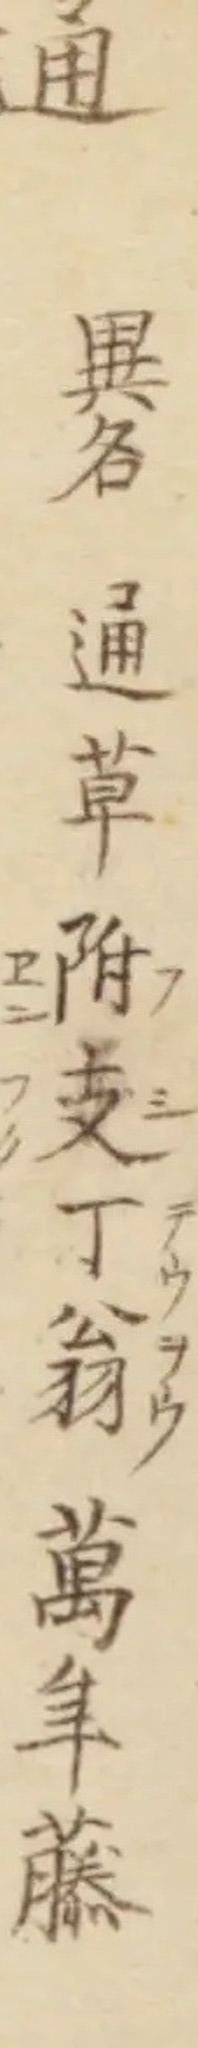木通異名通草附支丁翁万年藤
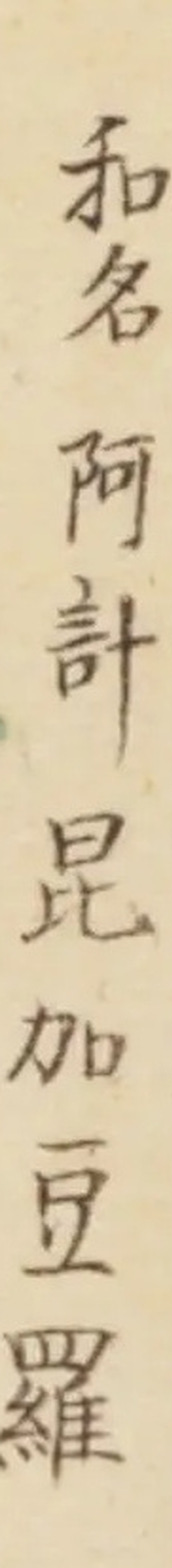和名阿計昆加豆羅
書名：梅園草木花譜春之部. 1
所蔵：国立国会図書館 National Diet Library, JAPAN
